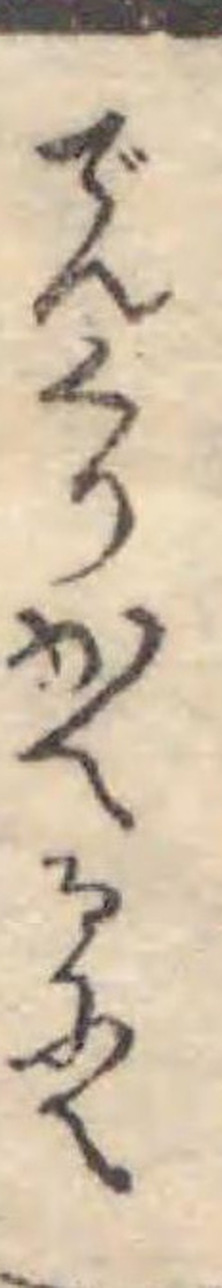でんくりかへるにて
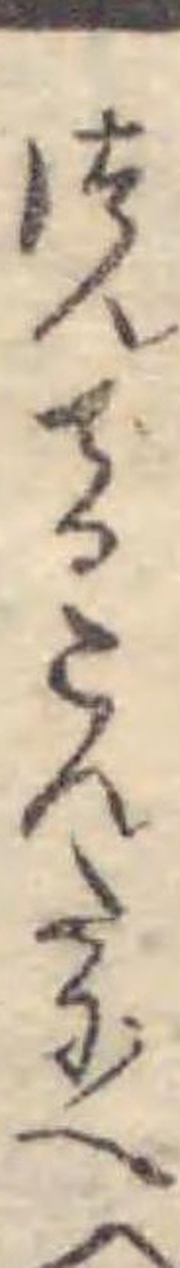つんてるこんたにへ
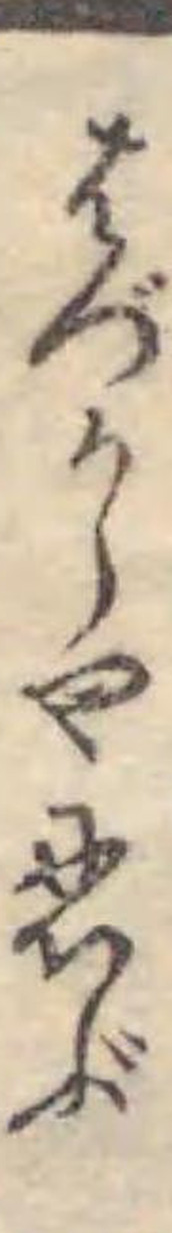はづかしや忍ぶ
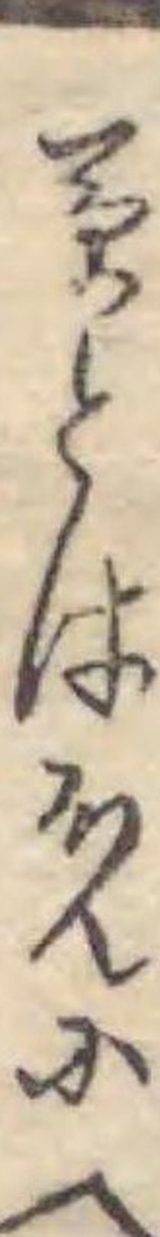草とはほんに
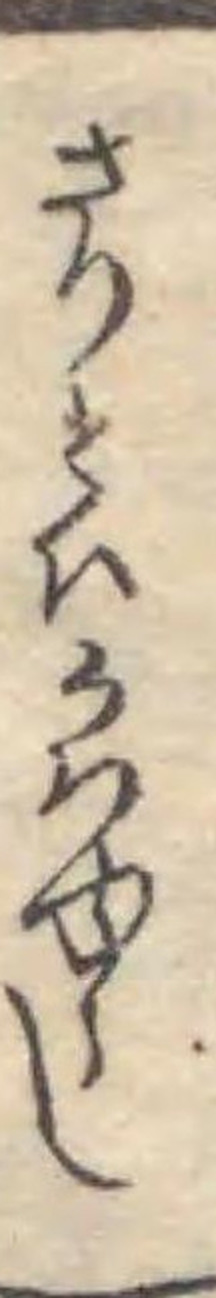さりとはかはゆらし
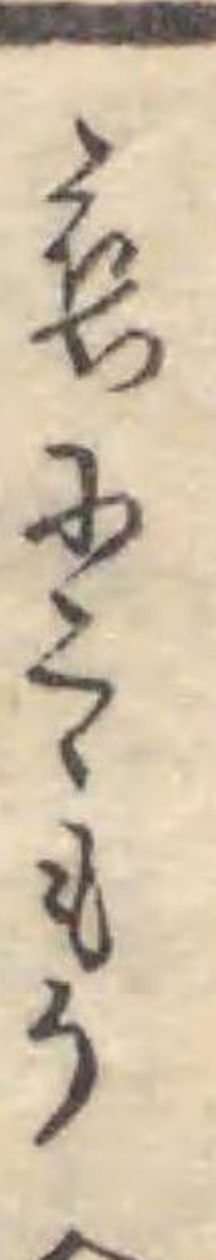恋にこ？ゝもう
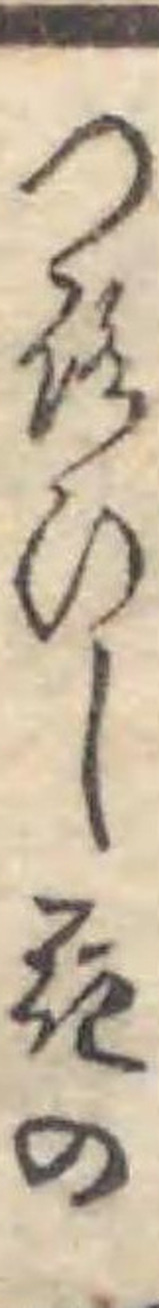つろひし花の
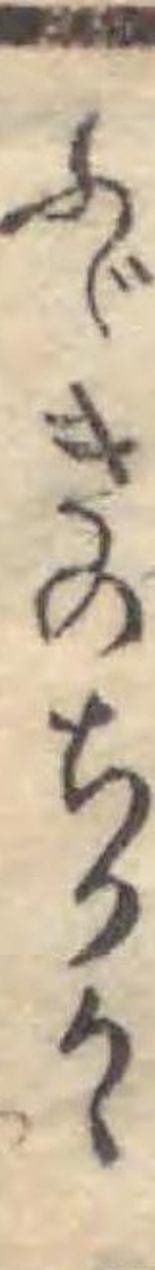ふゞきのちりかゝ
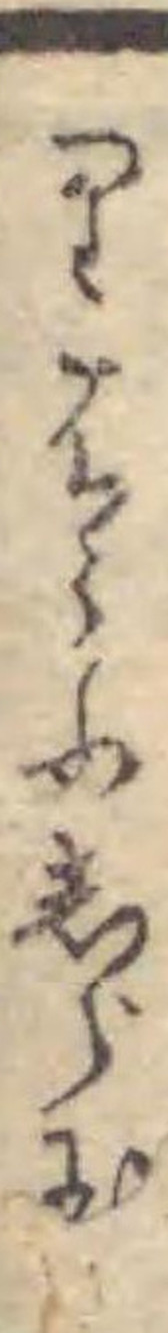りはらふしら玉
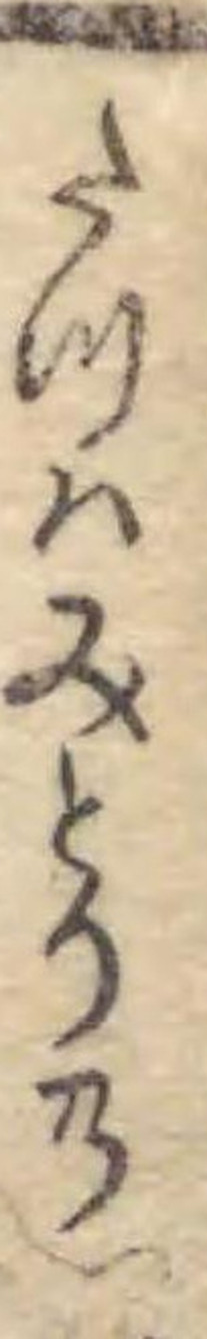たつはみとりの
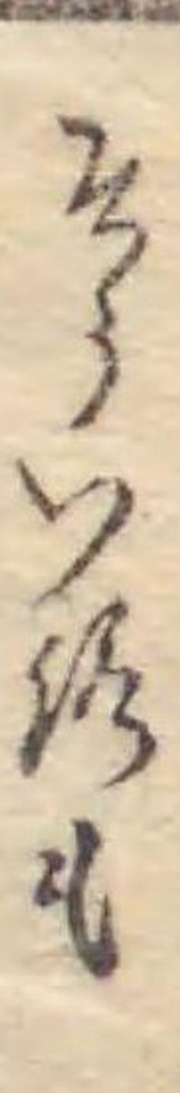そういろも
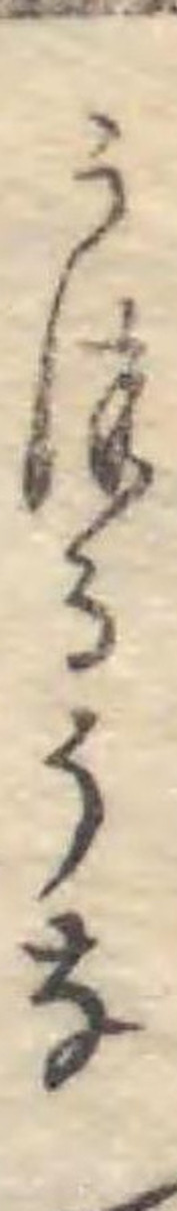うつるうな
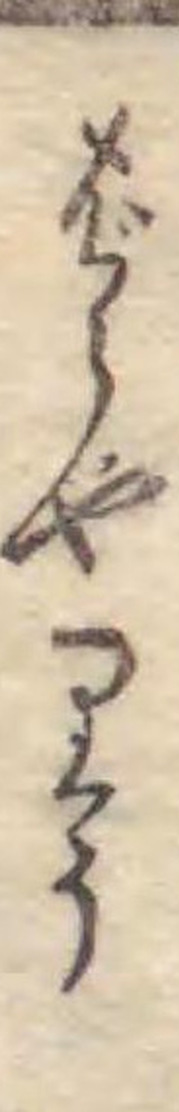ばらやりう
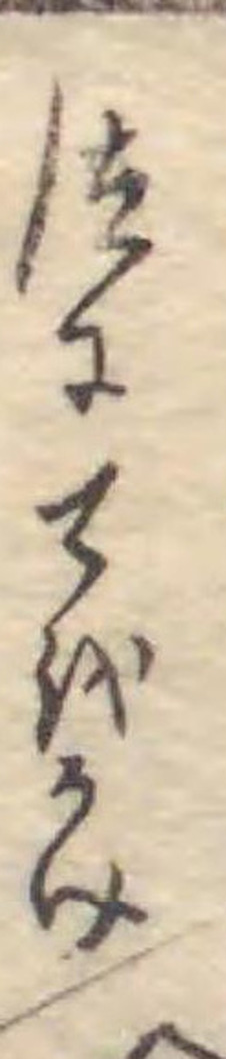つにてをかけ
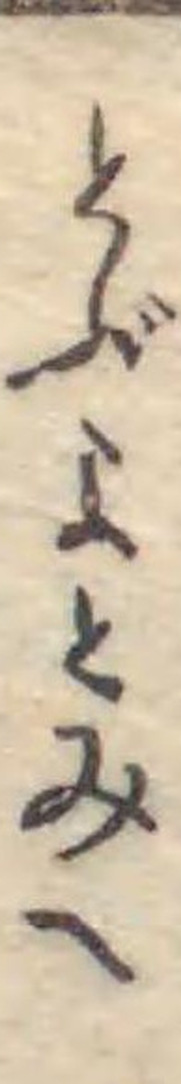とぶよとみへ
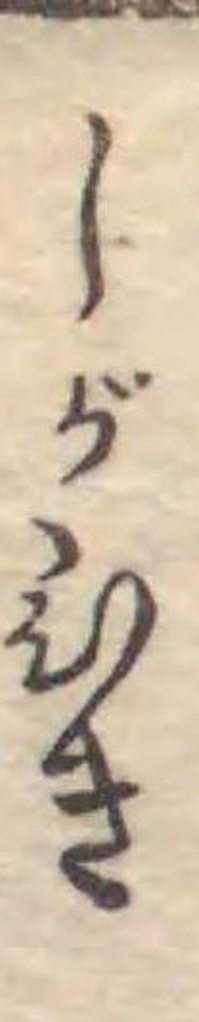しがひき
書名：鐘入七人化粧 : 3巻
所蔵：国立国会図書館 National Diet Library, JAPAN
